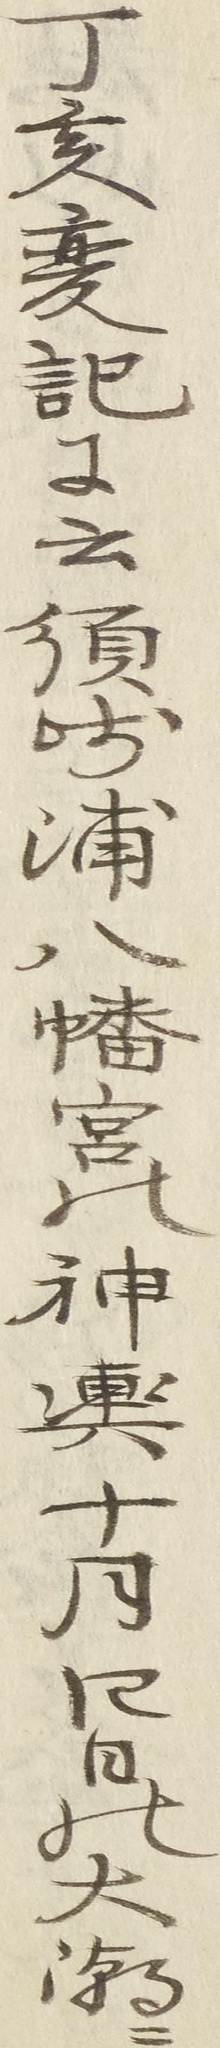丁亥変記に云須崎浦八幡宮の神輿十月四日の大潮に
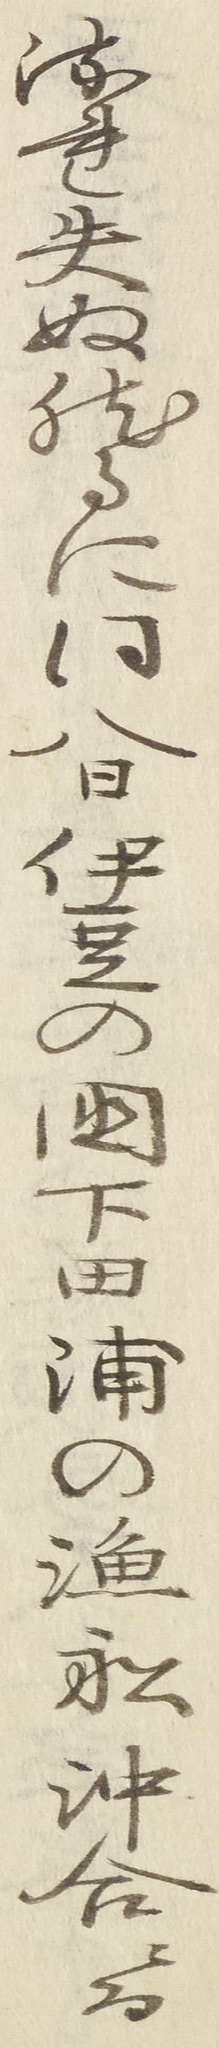流れ失ぬ然るに同八日伊豆の国下田浦の漁船沖合にて
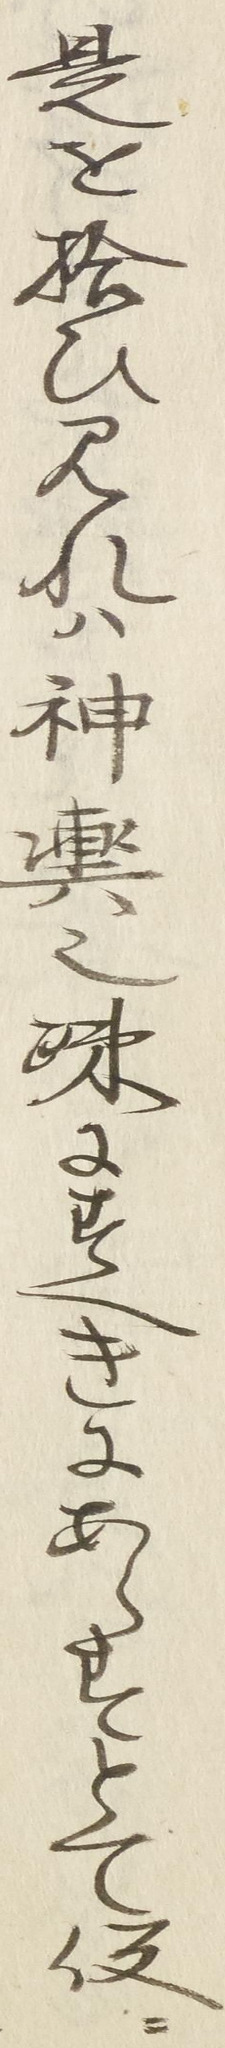是を拾ひ見れは神輿也疎にすへきにあらすとて仮に
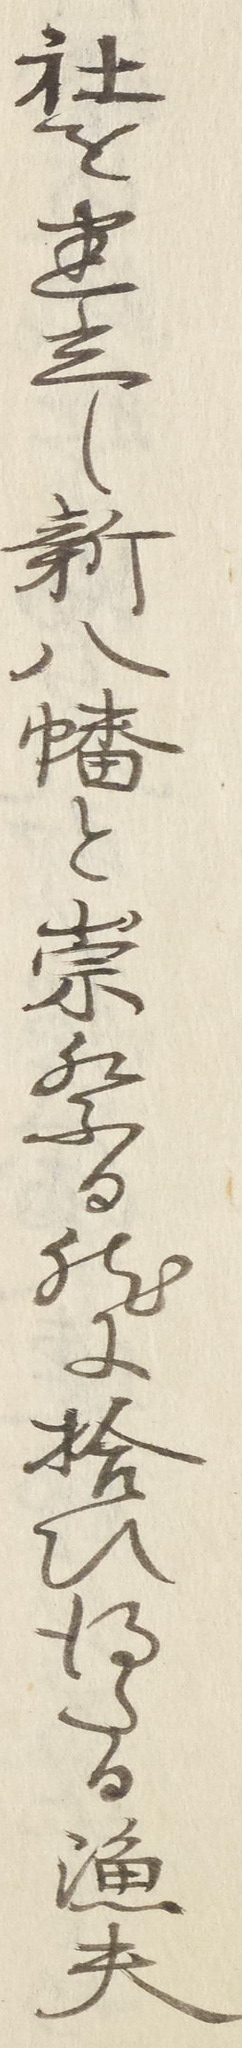社を建立し新八幡と崇祭る然に拾ひ得たる漁夫
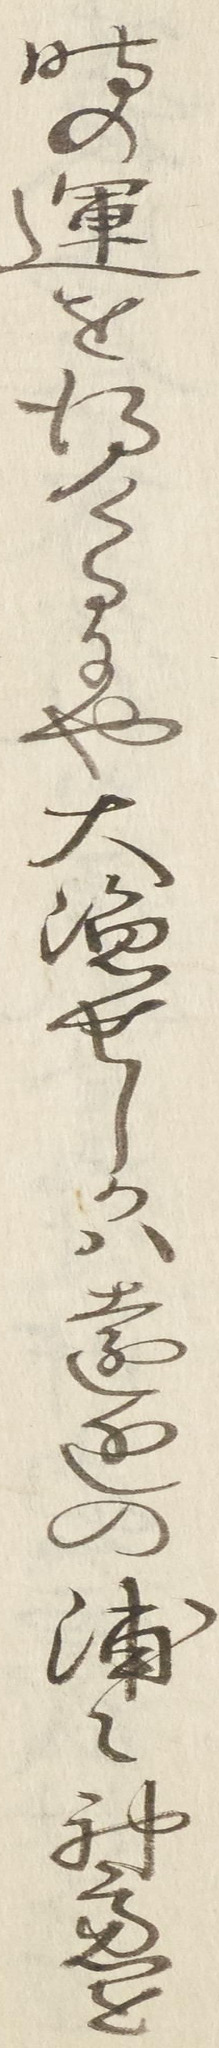時の運を得けるにや大漁せしかは遠近の浦々神慮を
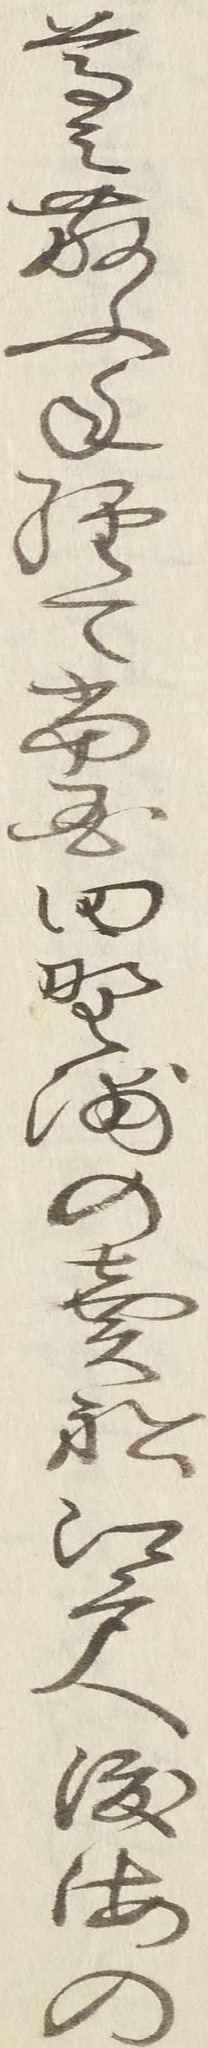尊み敬ふ年経て当国田野浦の売船江戸へ渡海の
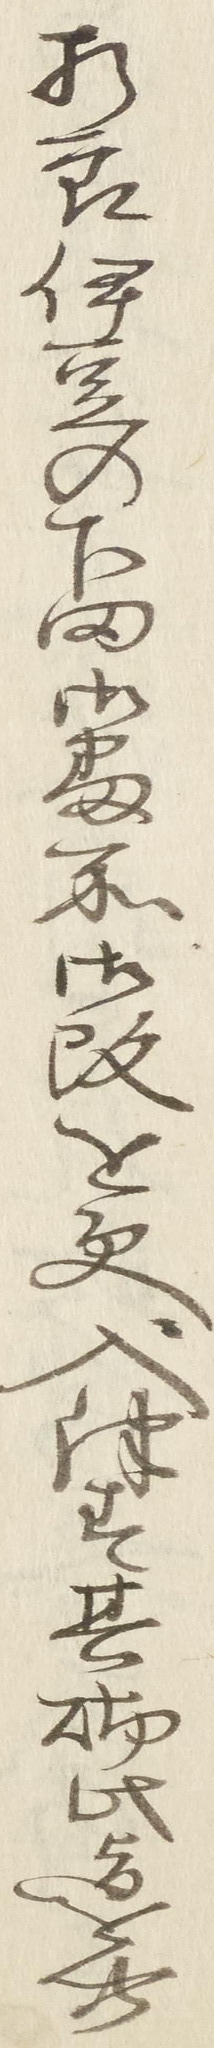折節伊豆の下田御番所御改を受入津す其砌此旨を聞
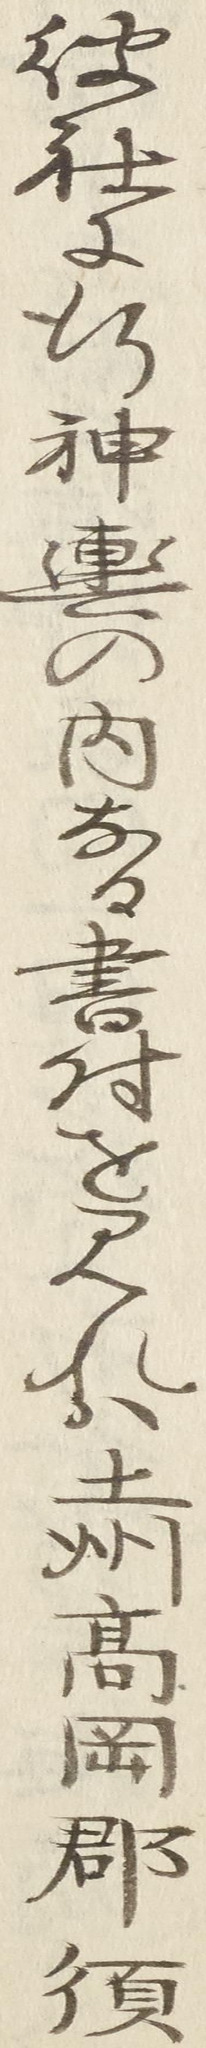彼社に行神輿の内なる書付を見れは土州高岡郡須
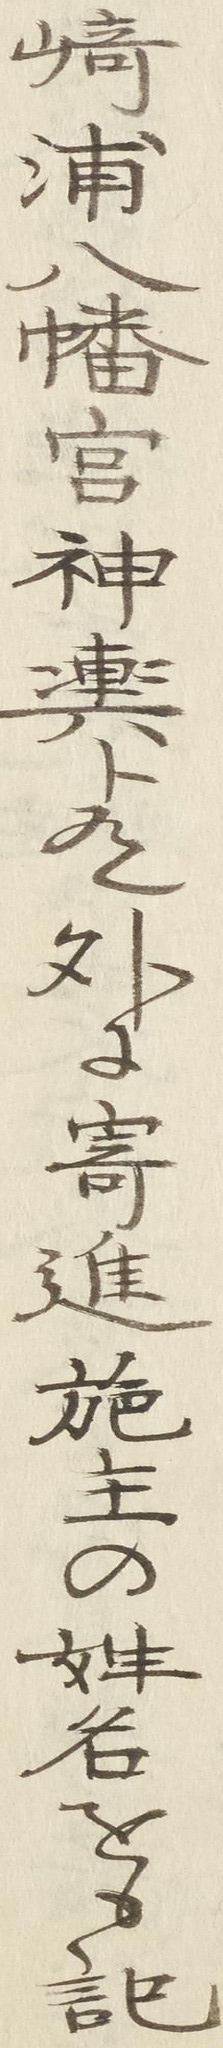崎浦八幡宮神輿と有外に寄進施主の姓名をも記
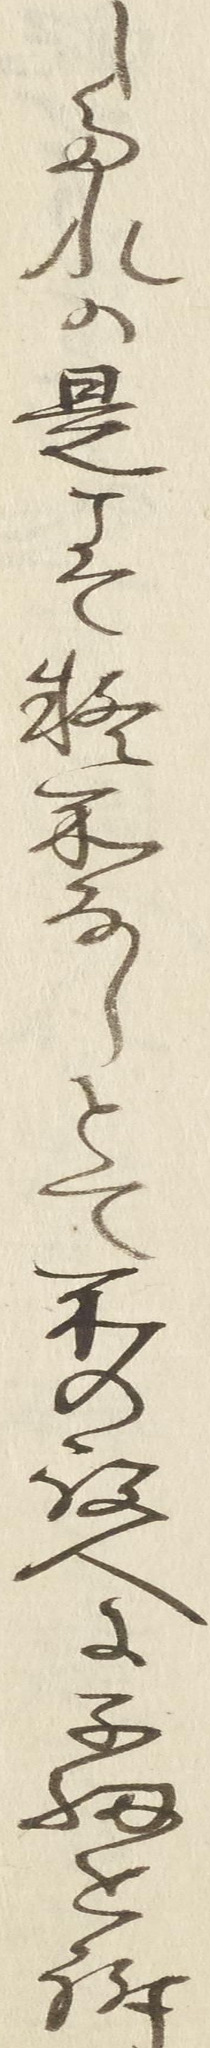したれは是こそ疑所なしとて所の役人に子細を訴
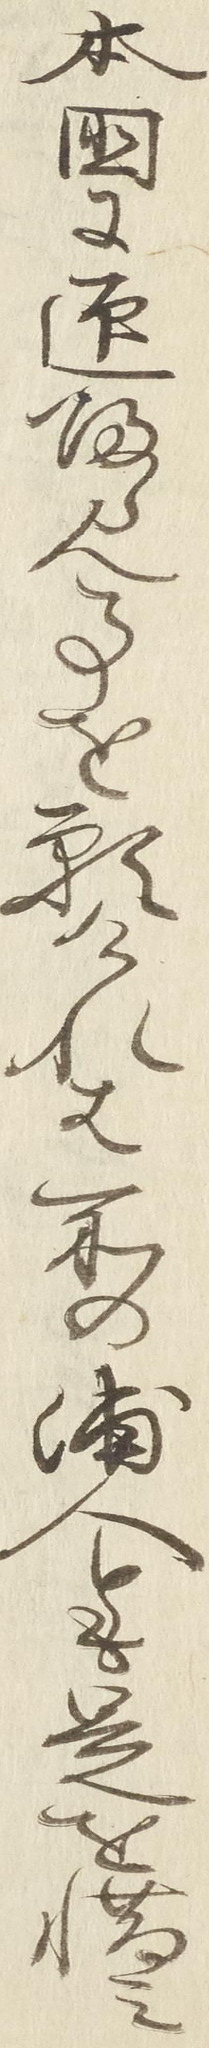本国に迎帰らん事を願けれは所の浦人とも是を惜み
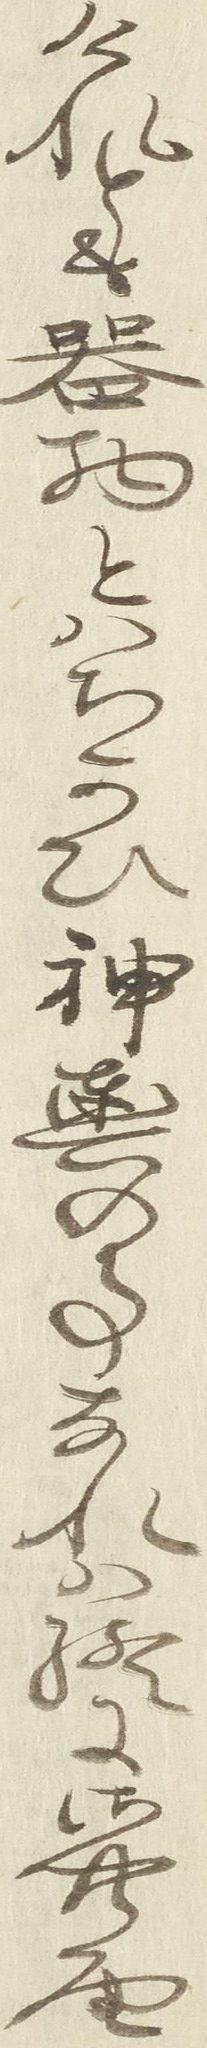けれとも器物とはちかひ神輿の事なれは終に御聞届
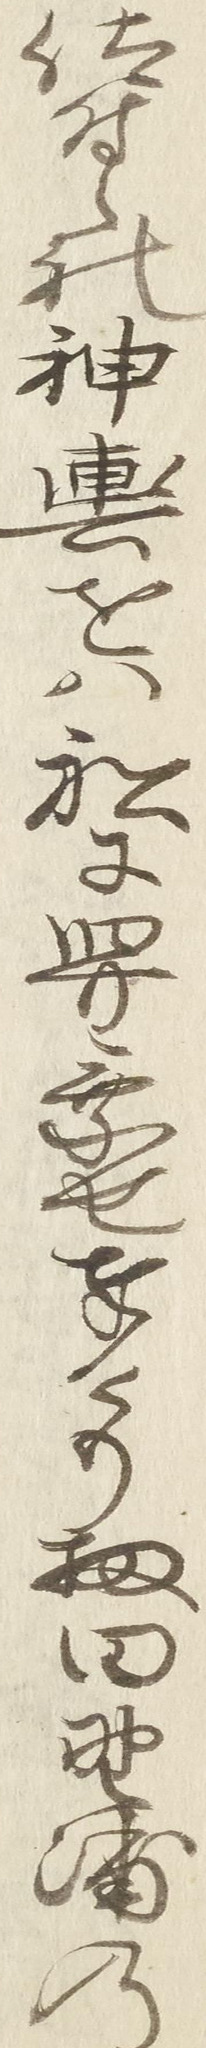仰付られ神輿をは船に舁乗せ奉けり扨田野浦の
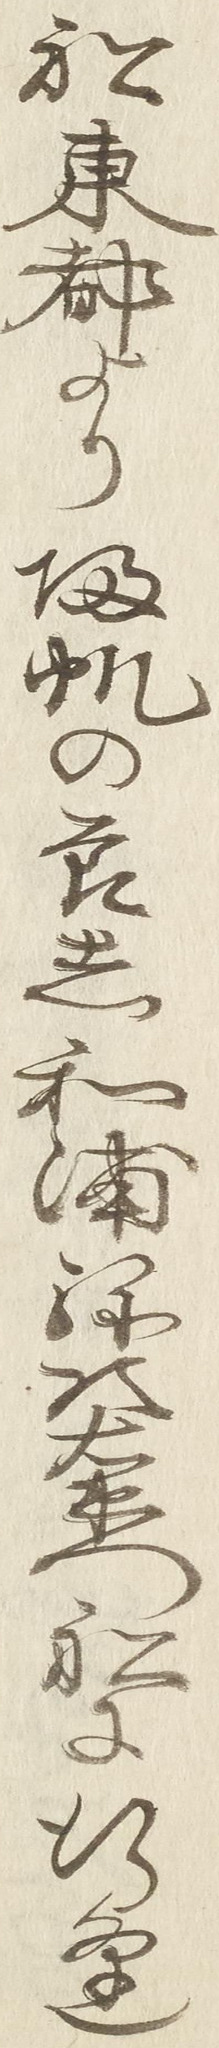船東都より帰帆の節志和浦弥次右衛門船に行逢
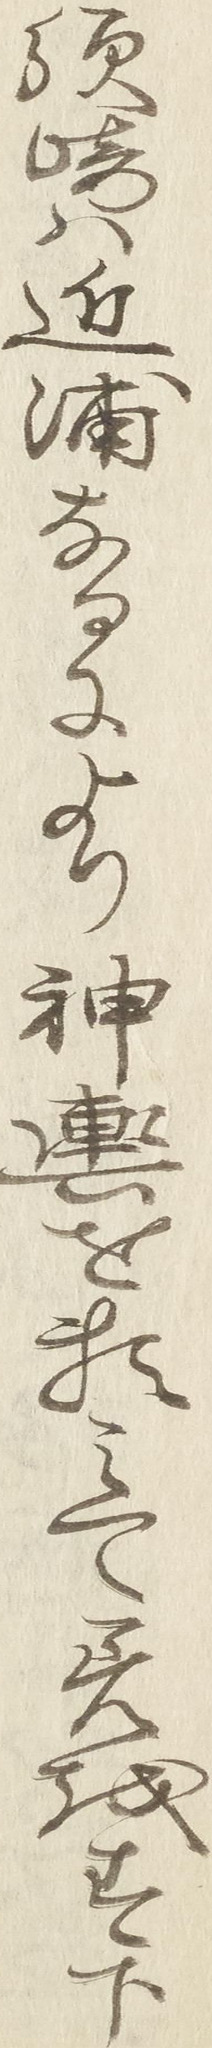須崎は近浦なるにより神輿を頼みて差越す下
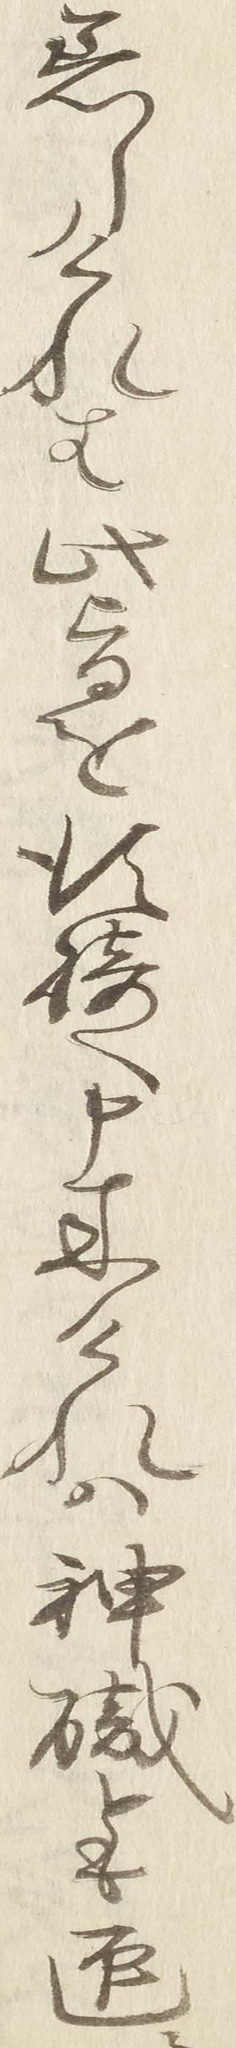着しけれは此旨を須崎へ申来けれは神職とも迎に
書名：地震記　上
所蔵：東京大学地震研究所図書室 Earthquake Research Institute Library, The University of Tokyo, JAPAN
